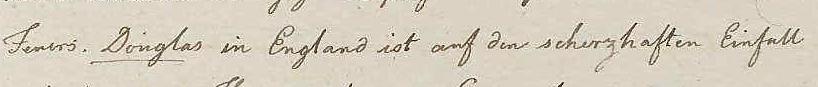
Feuers. Douglas in England ist auf den scherzhaften Einfall
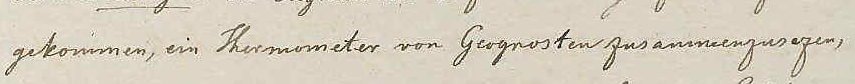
gekommen, ein Thermometer von Geognosten zusammenzusezen,
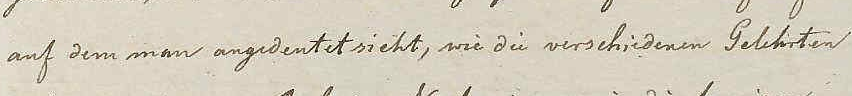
auf dem man angedeutet sieht, wie die verschiedenen Gelehrten
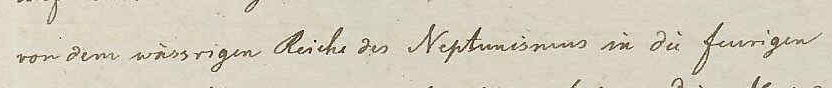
von dem wässrigen Reiche des Neptunismus in die feurigen
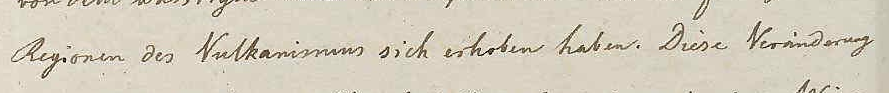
Regionen des Vulkanismus sich erhoben haben. Diese Veränderung
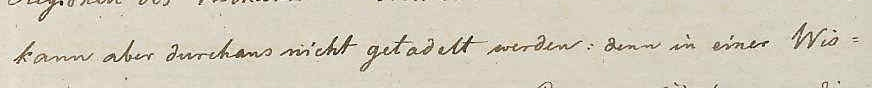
kann aber durchaus nicht getadelt werden: denn in einer Wis-
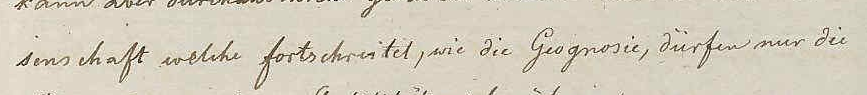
senschaft welche fortschreitet, wie die Geognosie, dürfen nur die
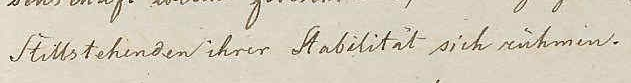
Stillstehenden ihrer Stabilität sich rühmen.
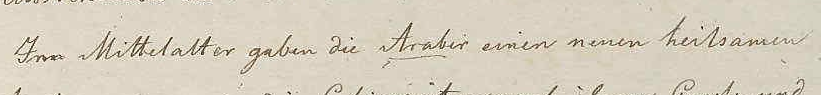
Im Mittelalter gaben die Araber einen neuen heilsamen
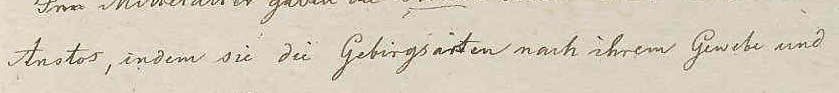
Anstos, indem sie die Gebirgsarten nach ihrem Gewebe und
